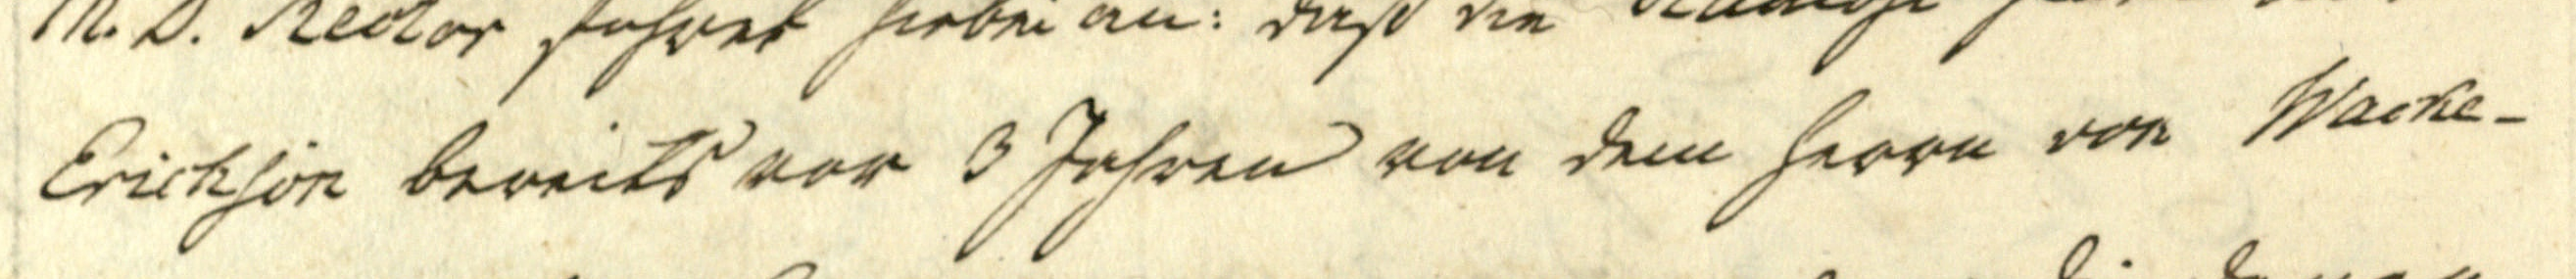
Erichson bereits vor 3 Jahren von dem Herrn von Wacke¬
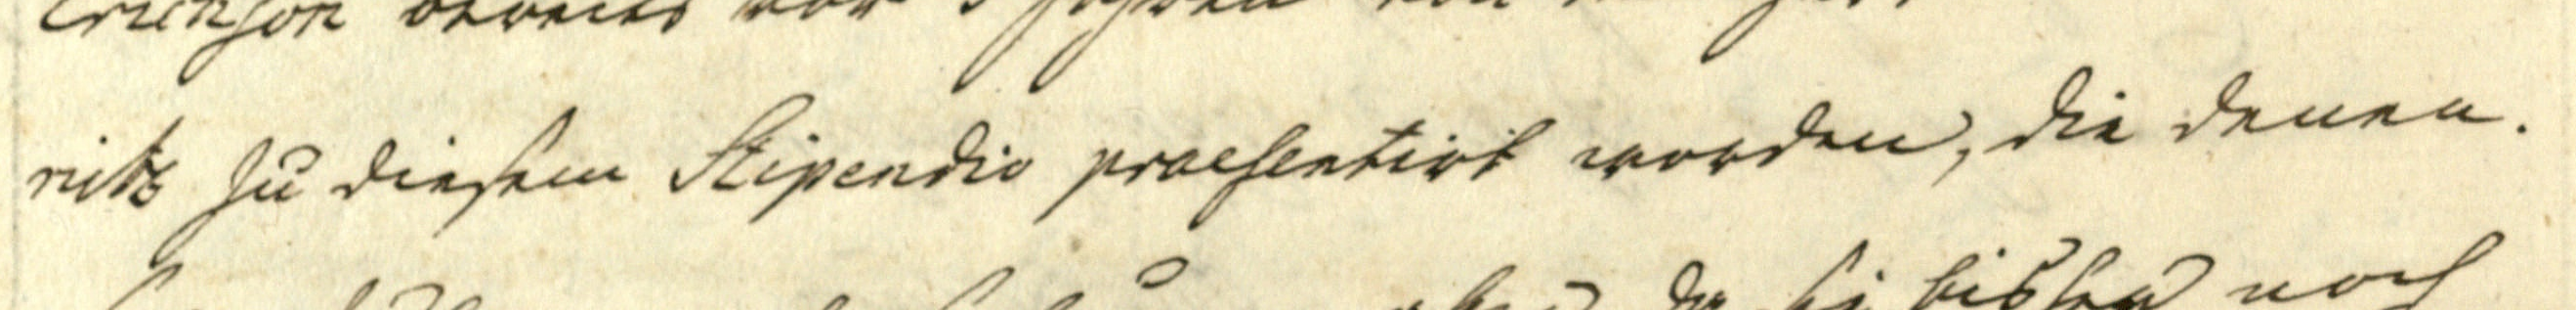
nitz zu diesem Stipendio praesentirt worden, die denen¬
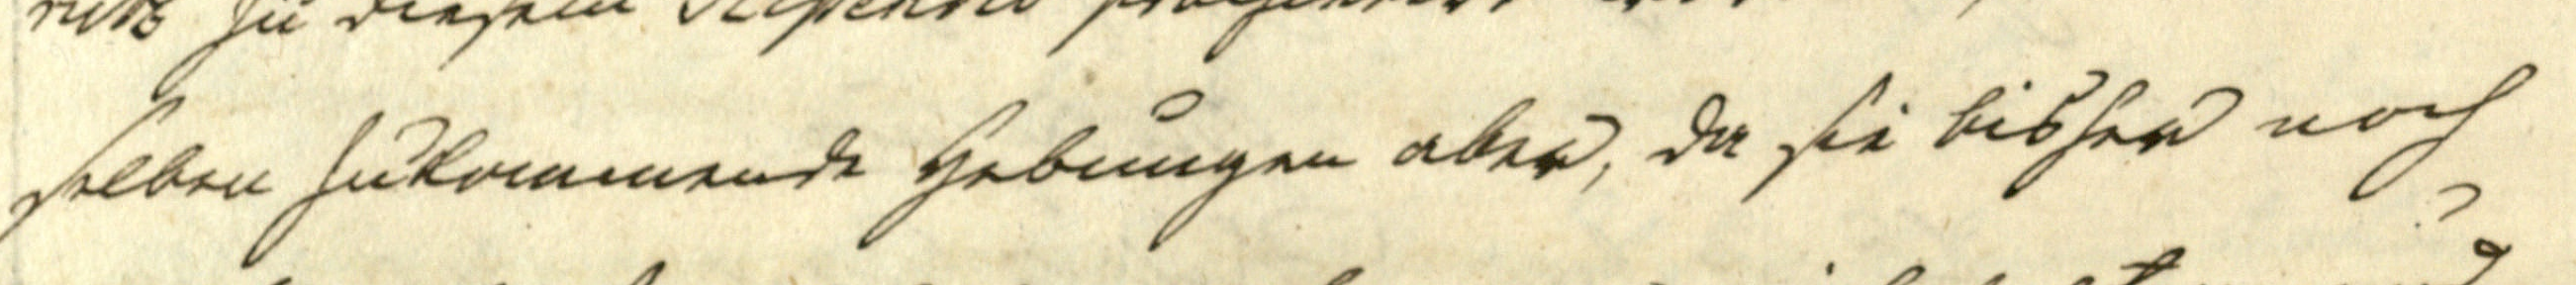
selben zukommende Hebungen aber, da sie bisher noch
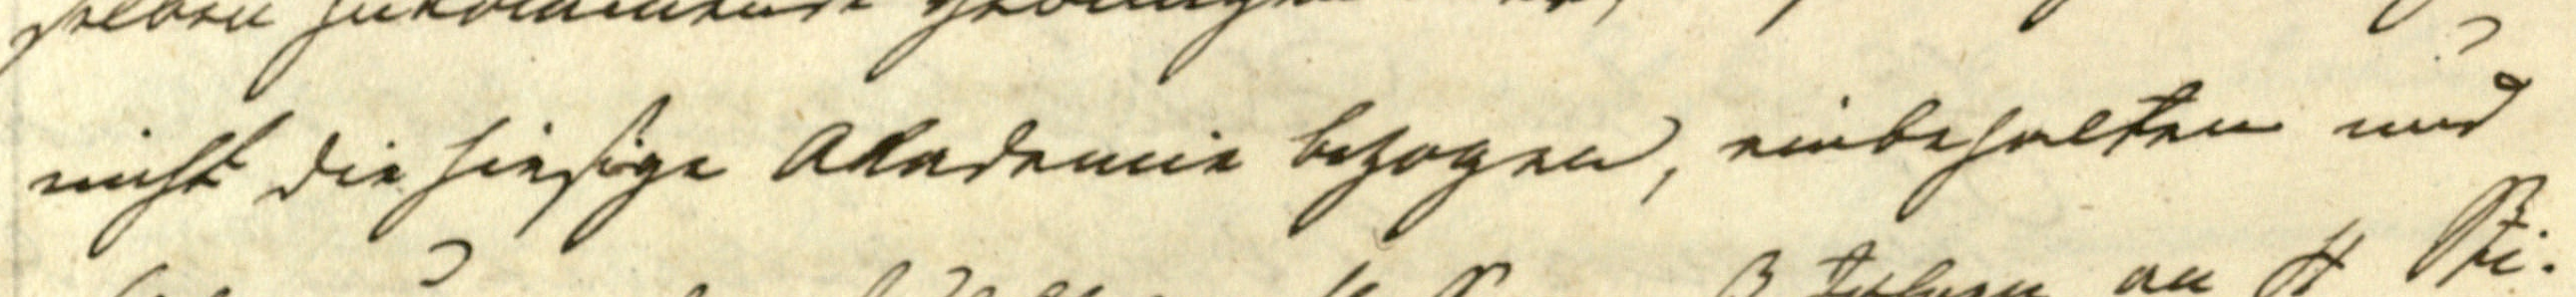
nicht die hiesige Akademie bezogen, einbehalten und
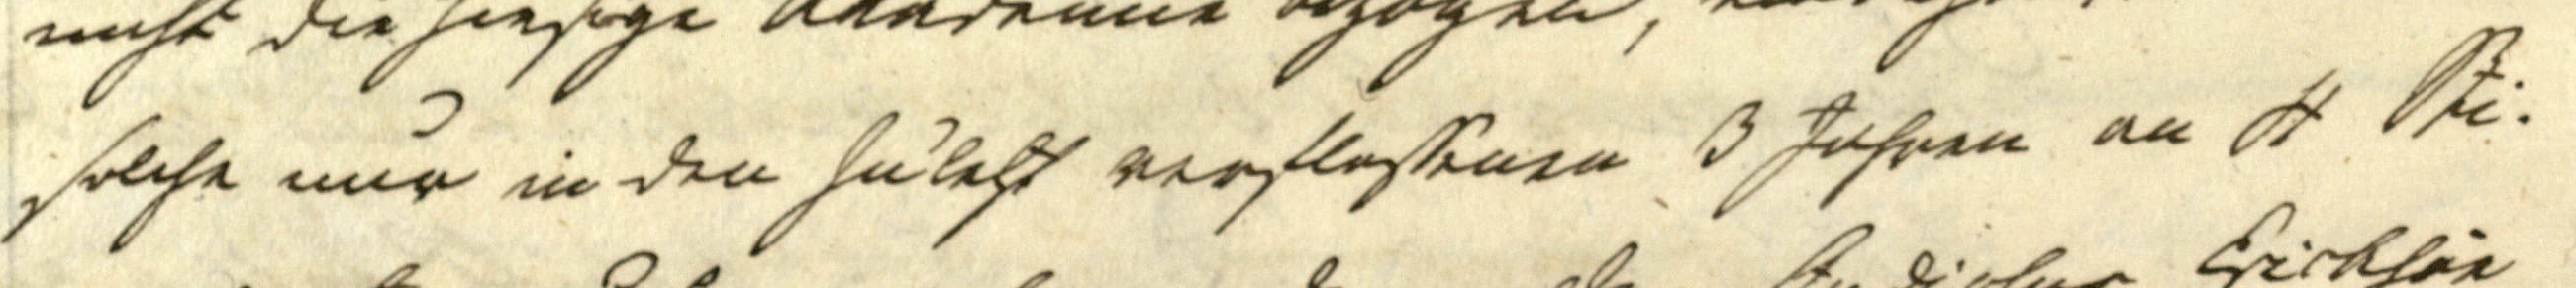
solche nur in den zuletzt verflossenen 3 Jahren an 4 Sti¬
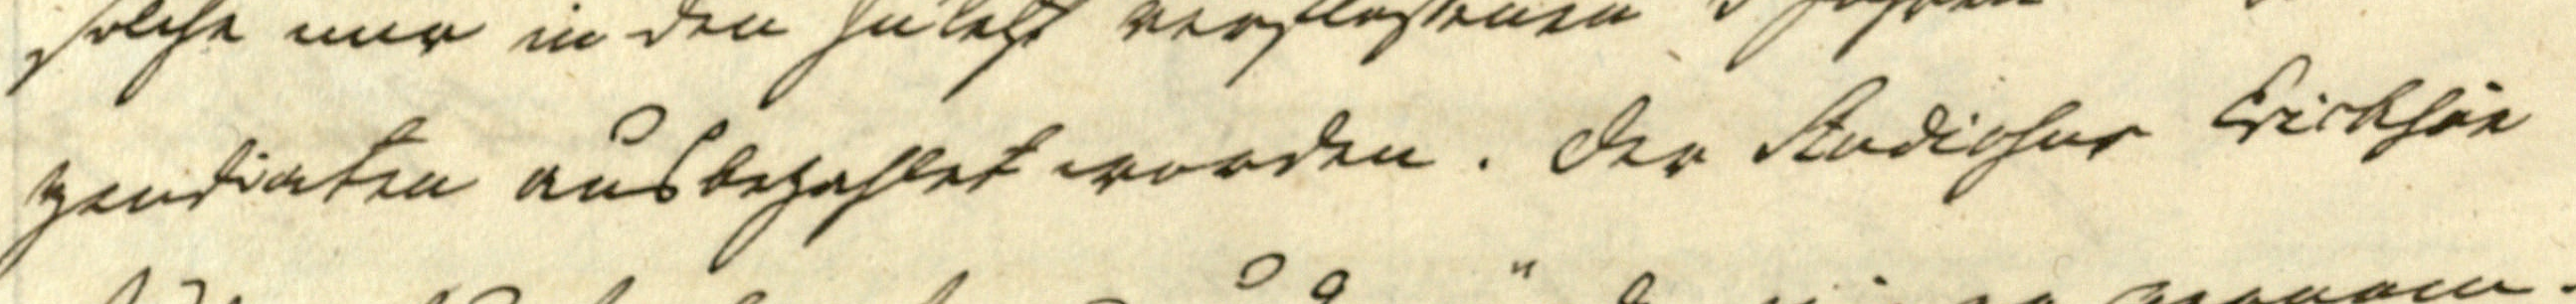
pendiaten ausbezahlet worden. Der Studiosus Erichson
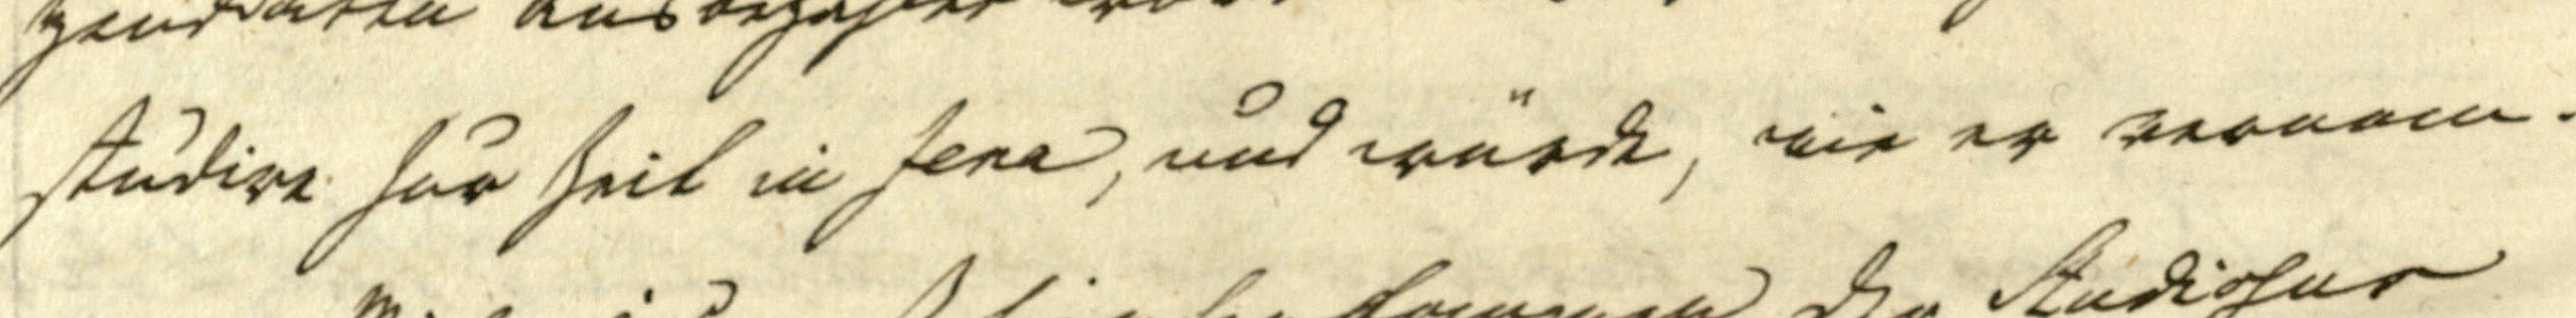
studire zur Zeit in Jena, und würde, wie er vernom¬
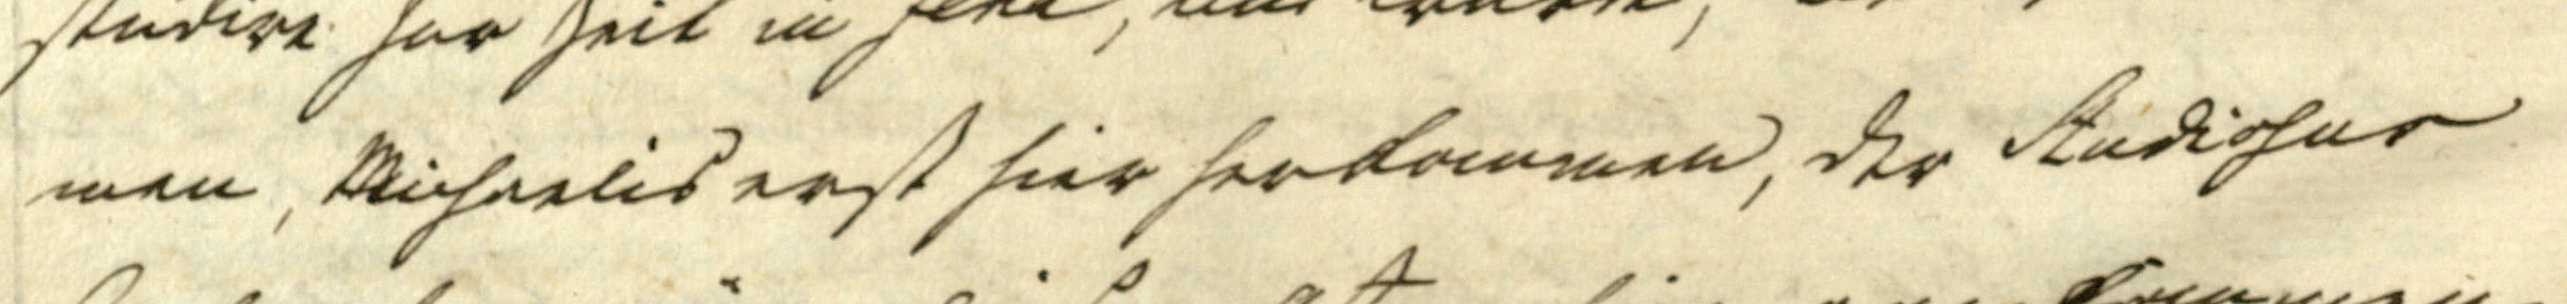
men, Michaelis erst hier herkommen, der Studiosus
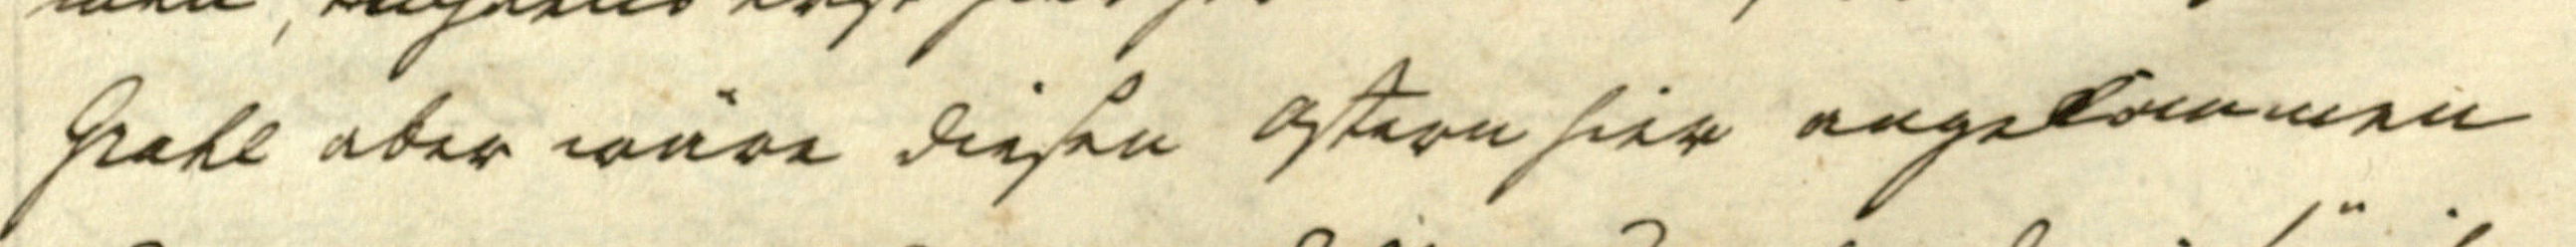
Grahl aber wäre diesen Ostern hier angekommen
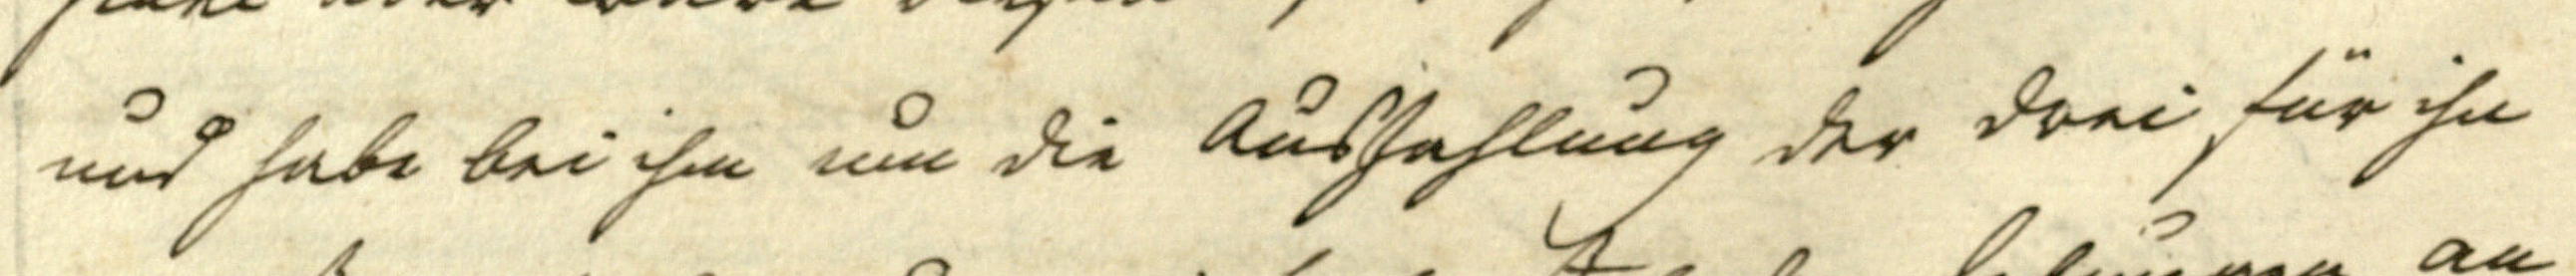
und habe bei ihm um die Auszahlung der der für ihn
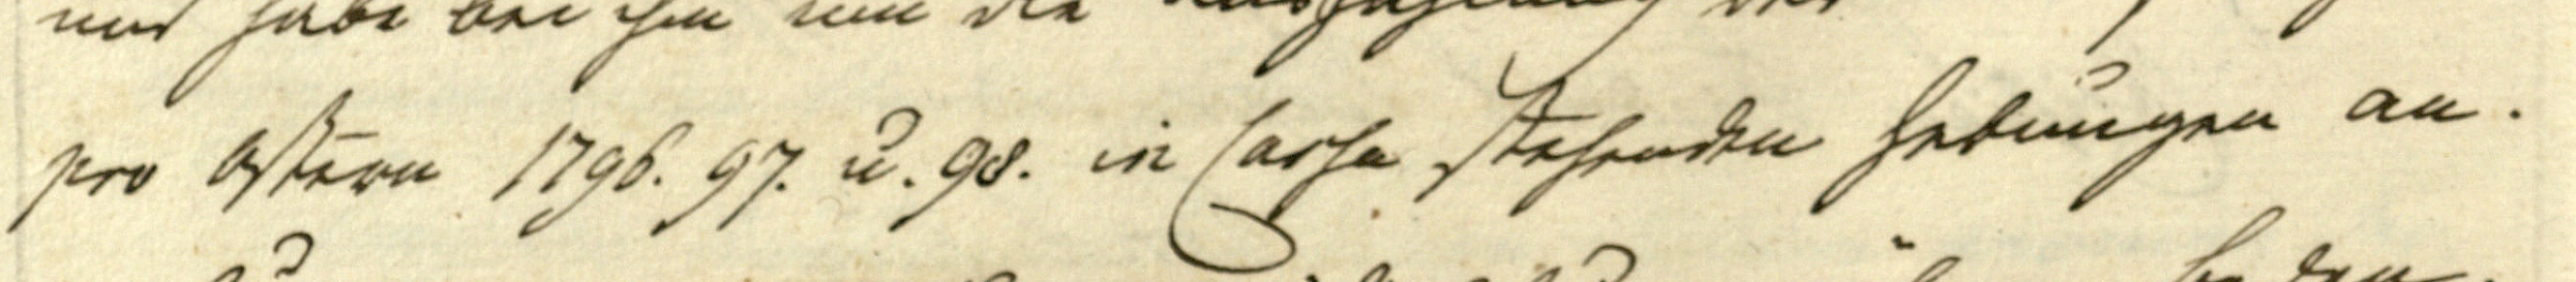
pro Ostern 1796. 97. u. 98. in Cassa stehenden Hebungen an¬
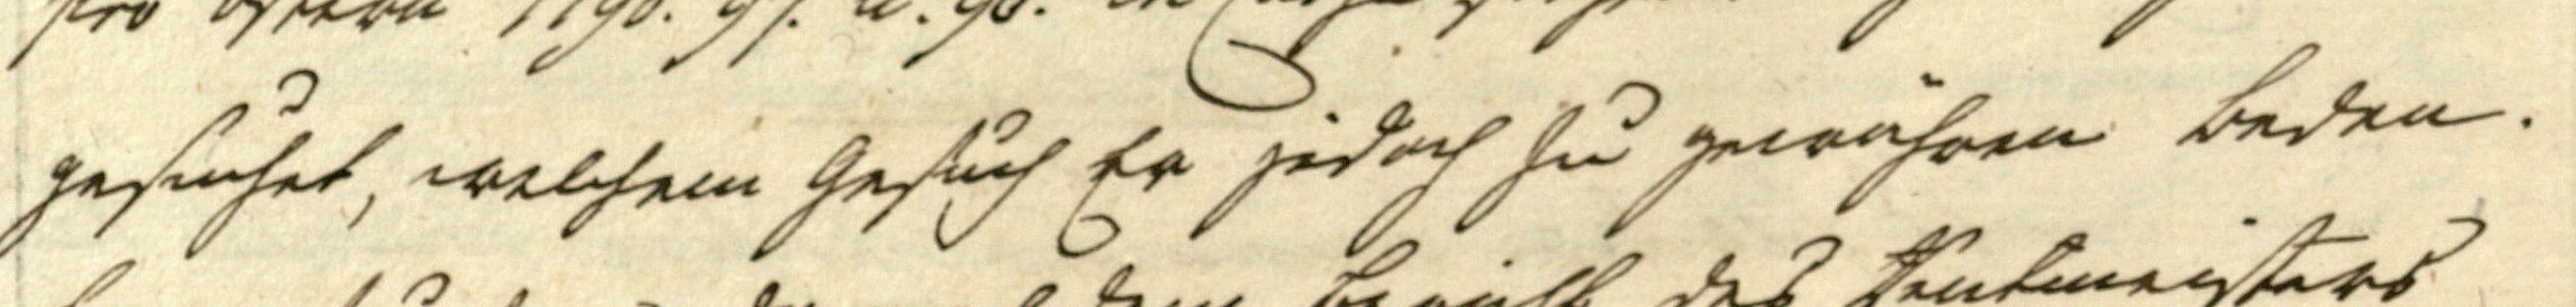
gesuchet, welchem Gesuch Er jedoch zu gewähren Beden¬
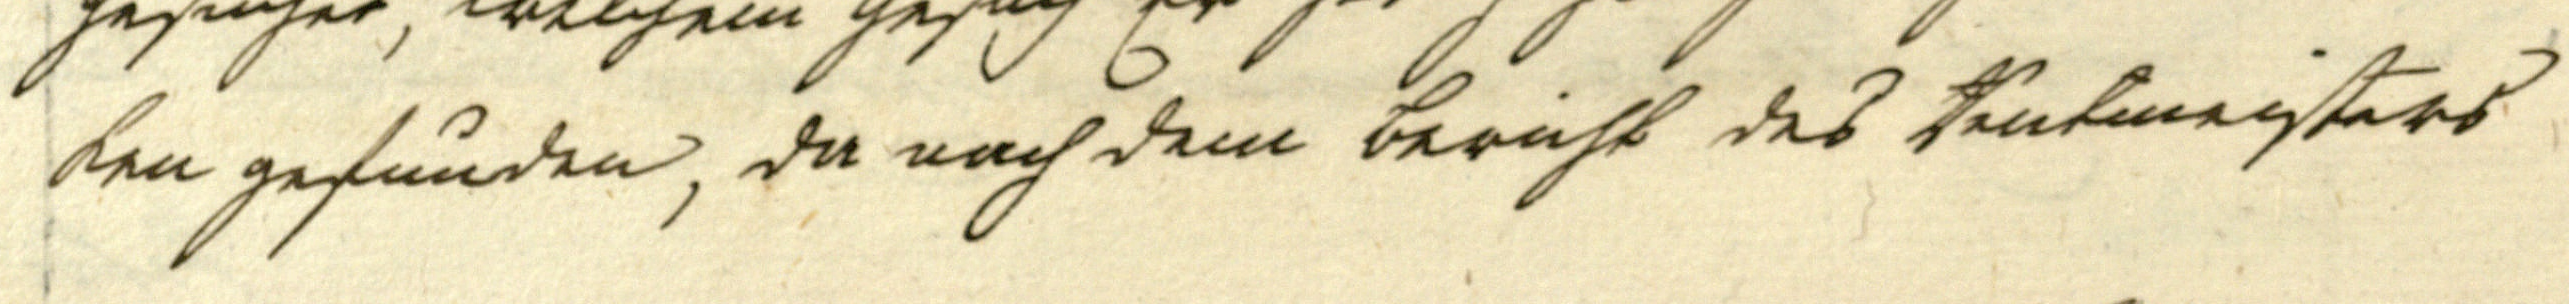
ken gefunden, da nach dem Bericht des Rentmeisters
